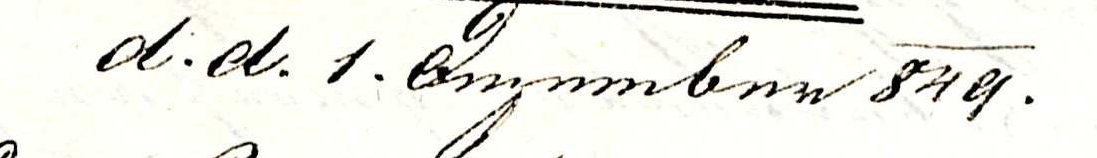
d. d. 1. Dezember 849.
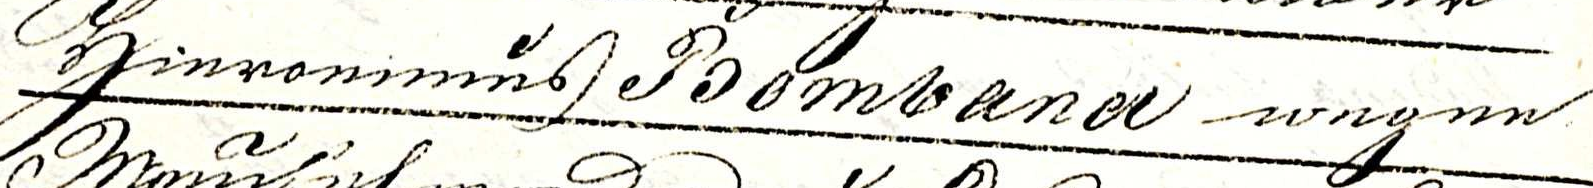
Hieronimus Bombana wegen
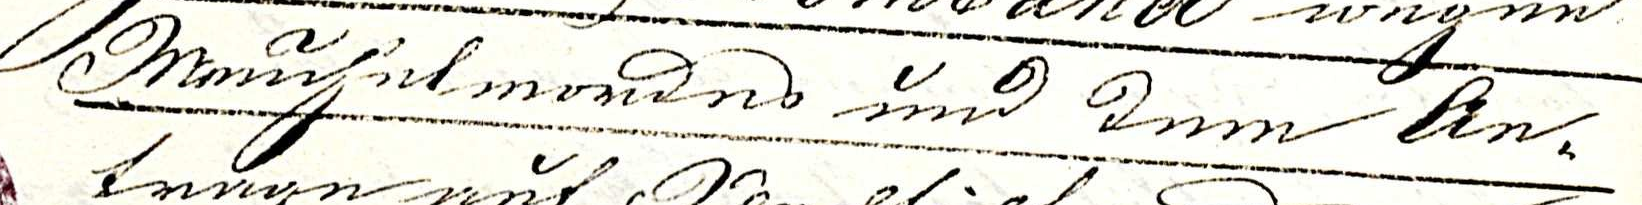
Meuchelmordes und dem An¬
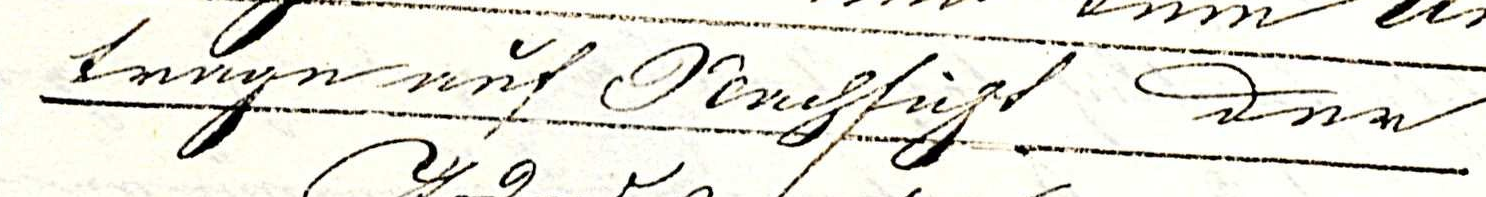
trage auf Nachsicht der
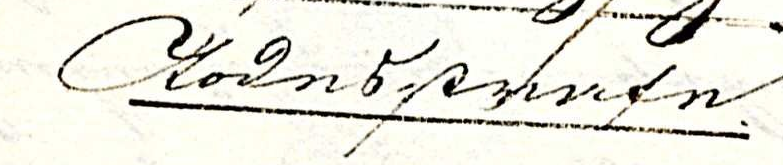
Todesstrafe.
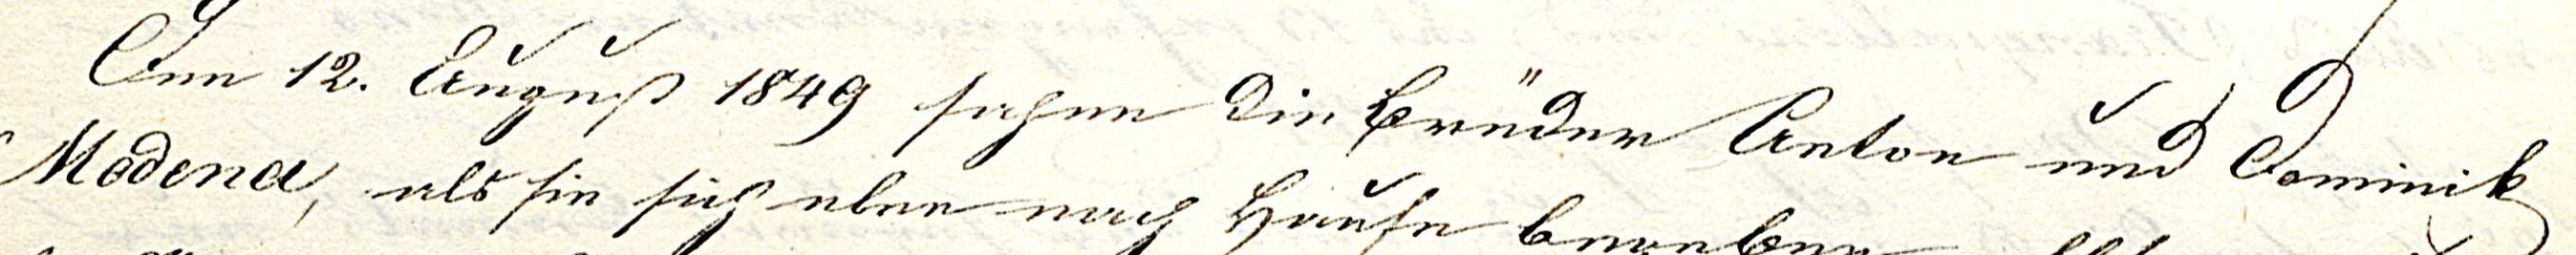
Den 12. August 1849 sahen die Brüder Anton und Dominik
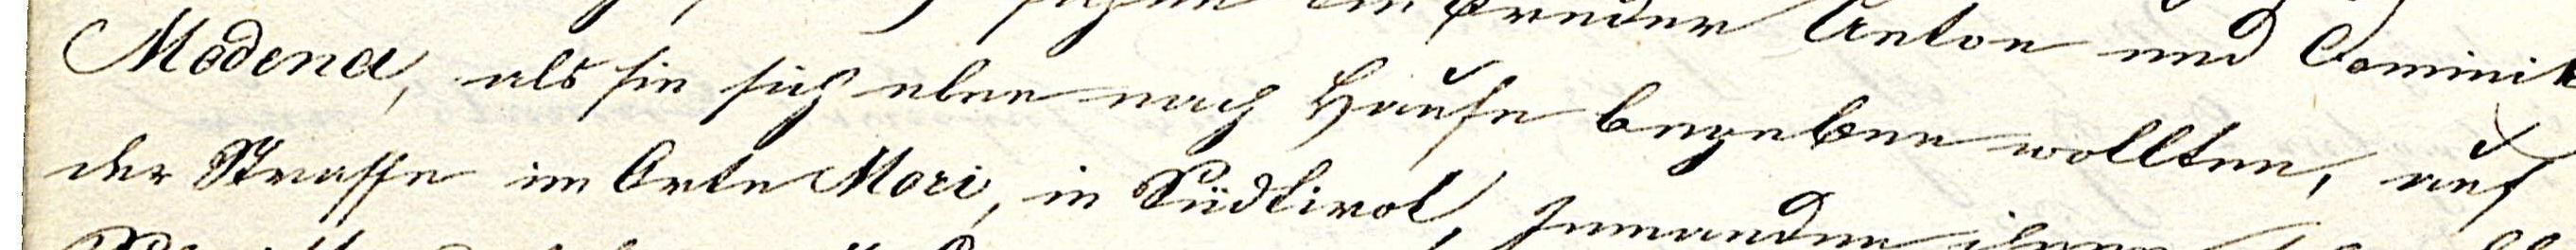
Modena, als sie sich eben nach Hause begeben wollten, auf
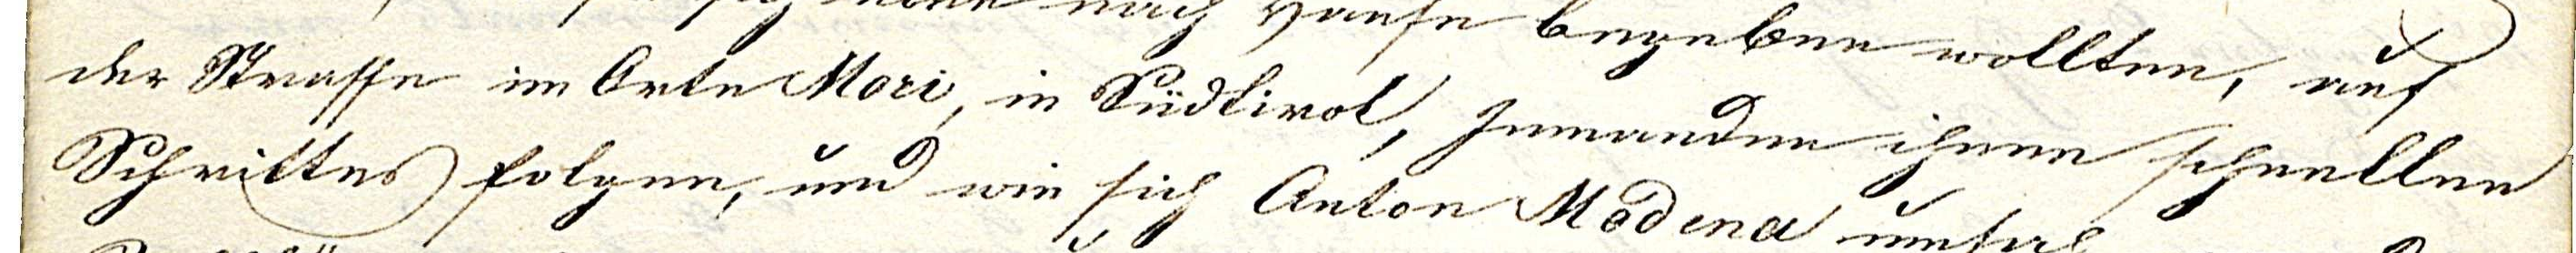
der Strasse im Orte Mori, in Südtirol, Jemanden ihnen schnellen
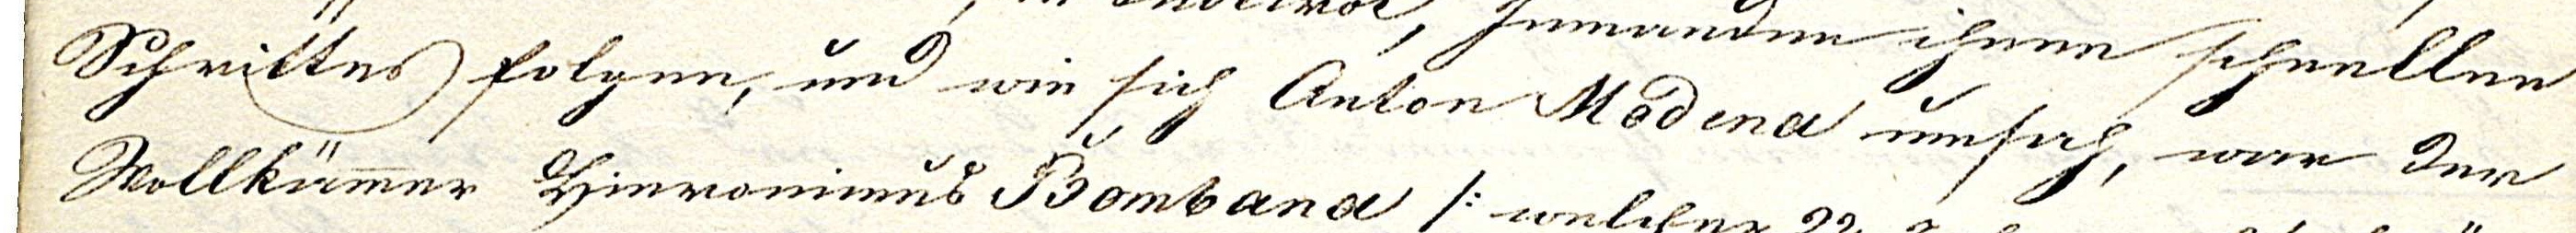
Schrittes folgen, und wie sich Anton Modena umsah, war der
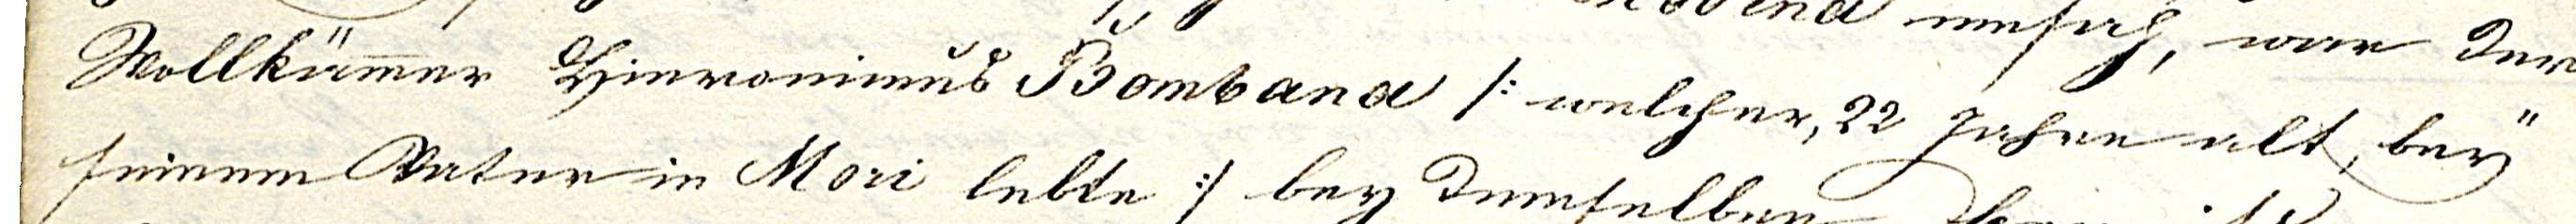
Wollkämmer Hieronimus Bombana /: welcher, 22 Jahre alt, bey
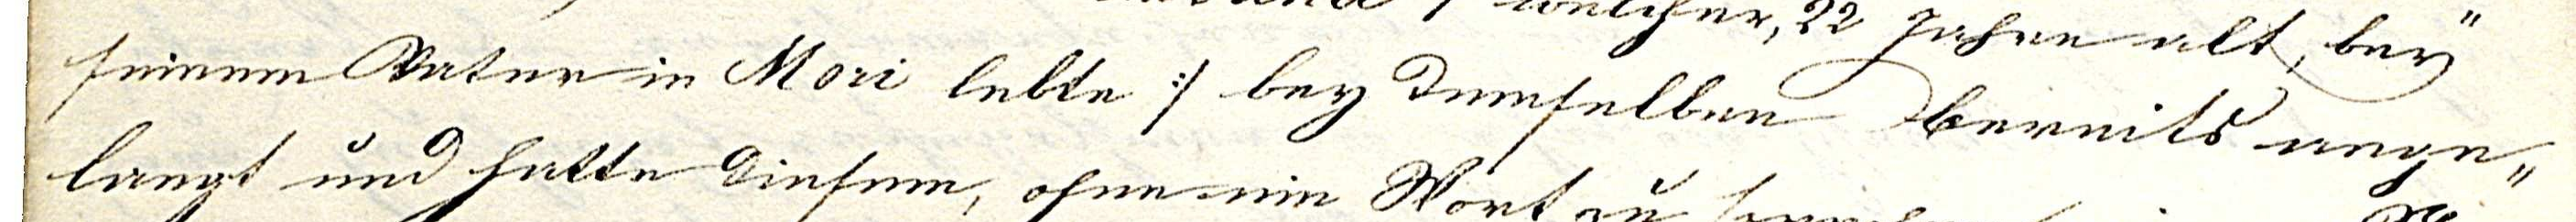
seinem Vater in Mori lebte :/ bey demselben xxereits ange¬
